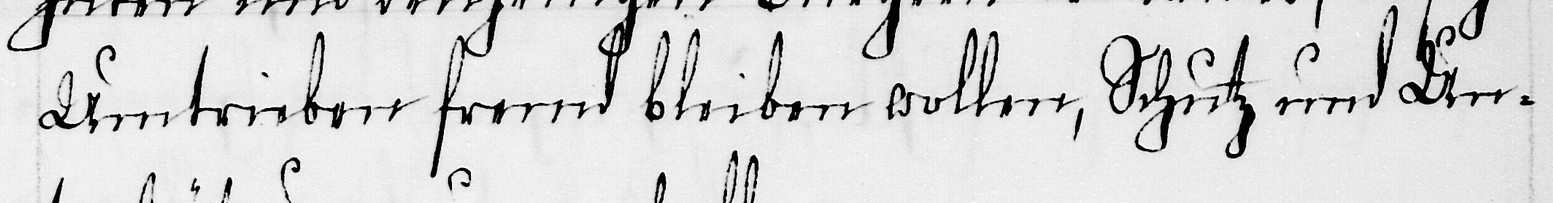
Umtrieben fremd bleiben wollen, Schutz und Un¬
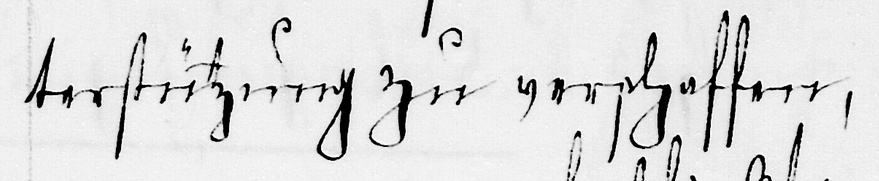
terstützung zu verschaffen,
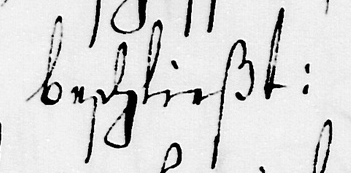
beschließt:
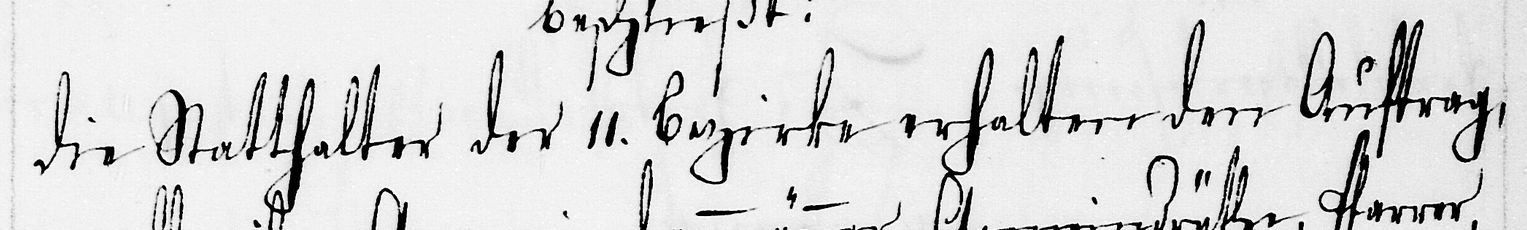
die Statthalter der 11. Bezirke erhalten den Auftrag,
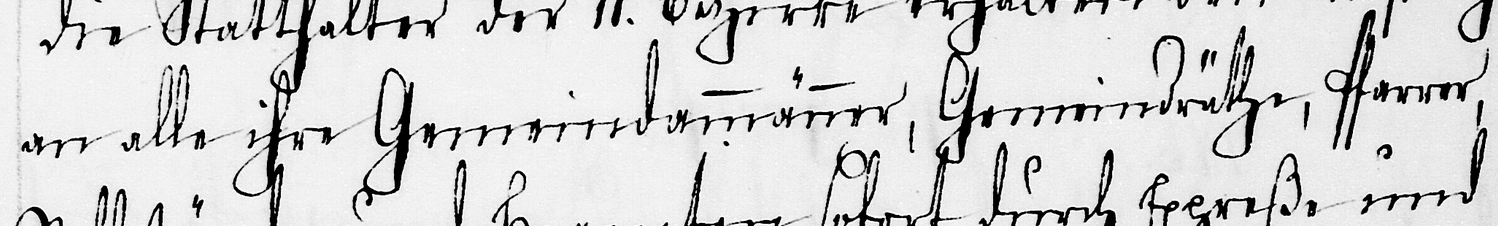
an alle ihre Gemeindammänner, Gemeindräthe, Pfarre¬
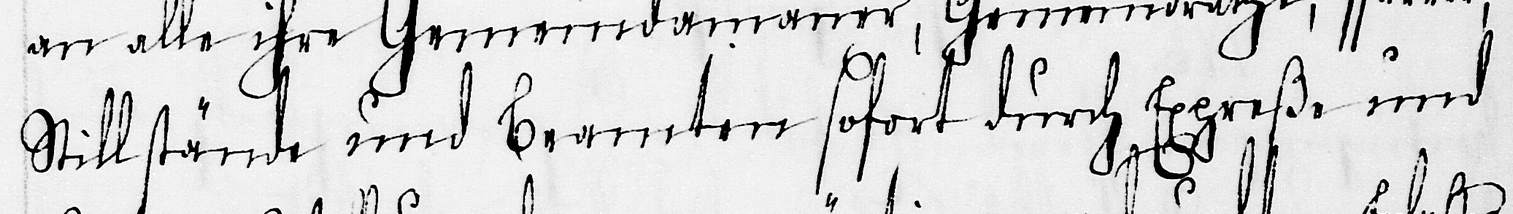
Stillstände und Beamten sofort durch Expreße und
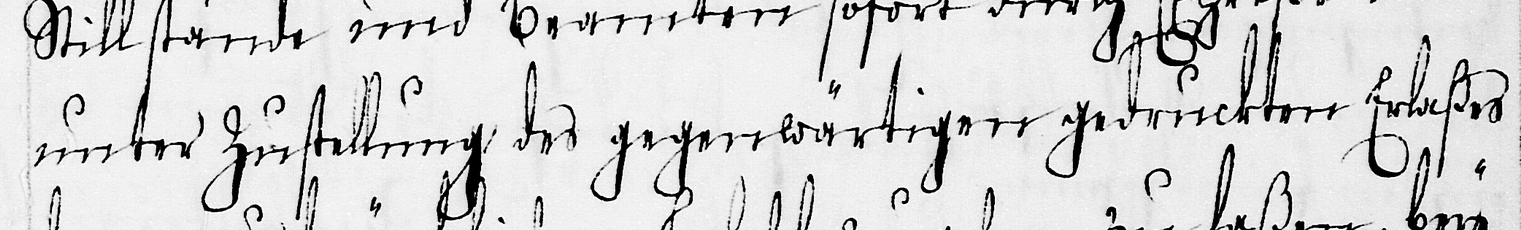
unter Zustellung des gegenwärtigen gedruckten Erlaßes
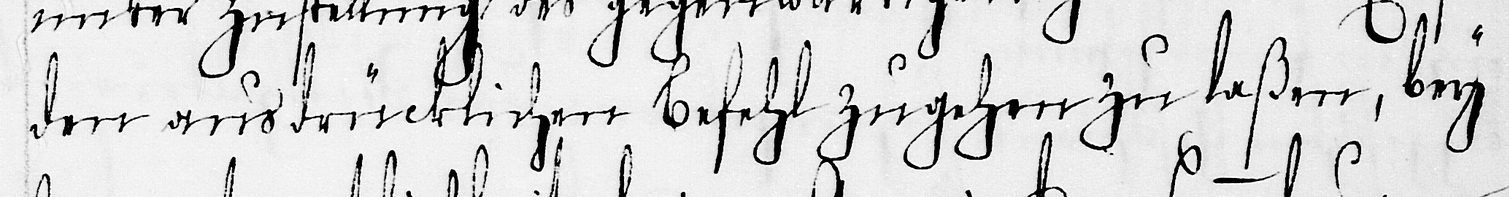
den ausdrücklichen Befehl zugehen zu laßen, bey
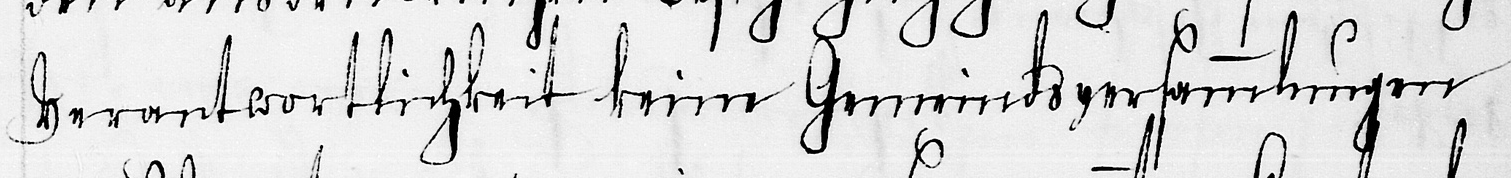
Verantwortlichkeit keine Gemeindsversammlungen
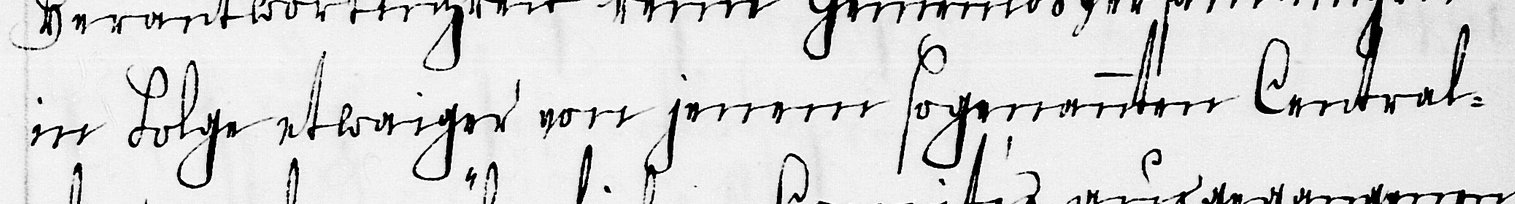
in Folge etwaiger von jenem sogenannten Central-
